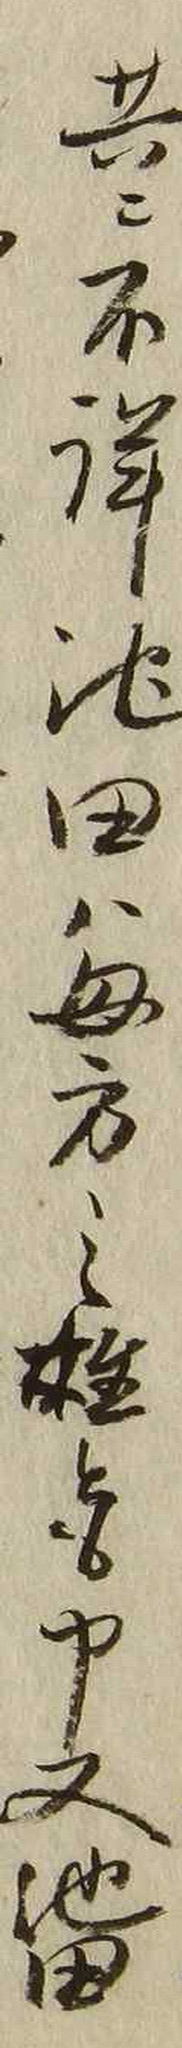共ニ不詳池田ハ母方之姓とも申又池田
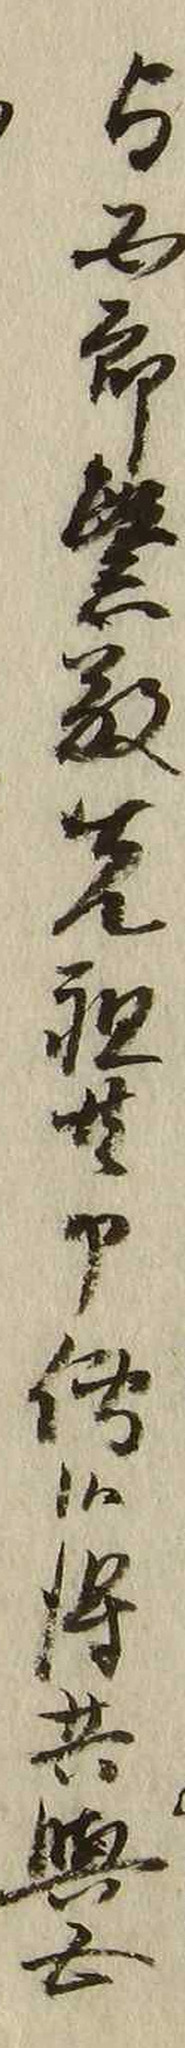与五郎繁敬先祖共申伝候得共与五
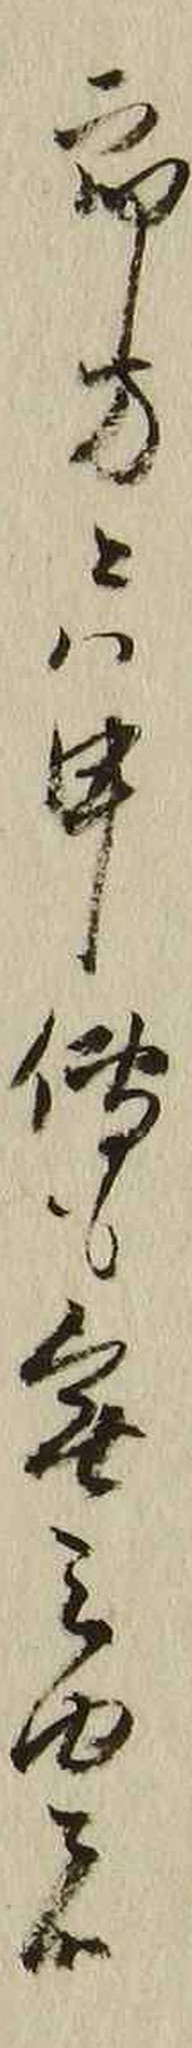郎方ニハ申伝も無之由ニ候
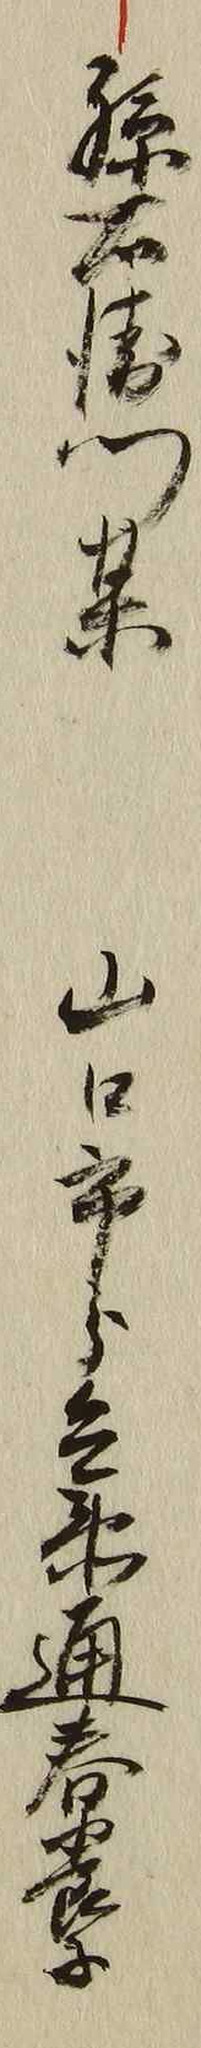孫右衛門某山口市郎兵衛通春養子
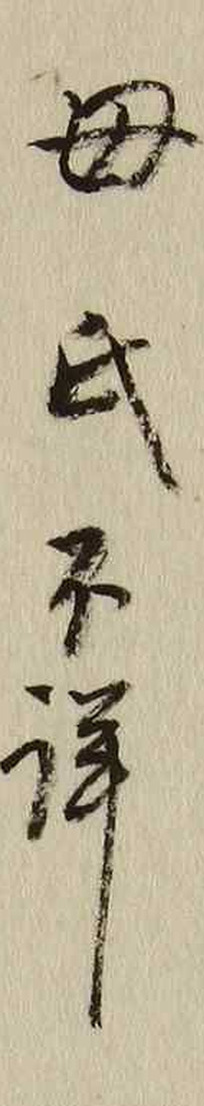母氏不詳
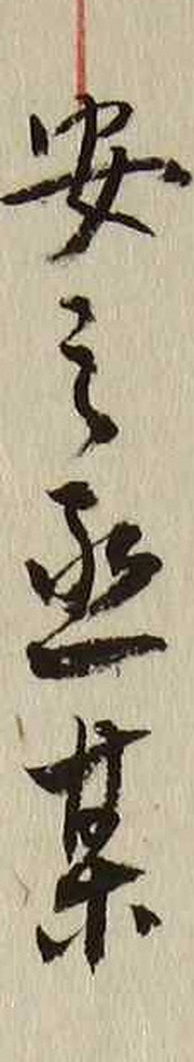安之丞某
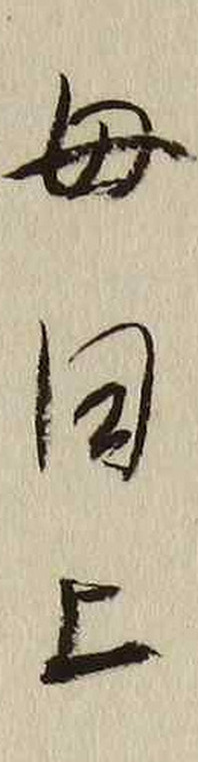母同上
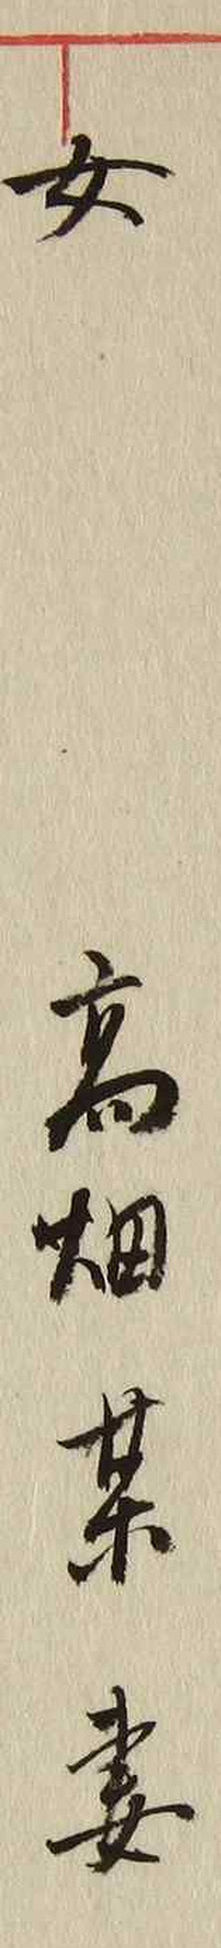女高畑某妻
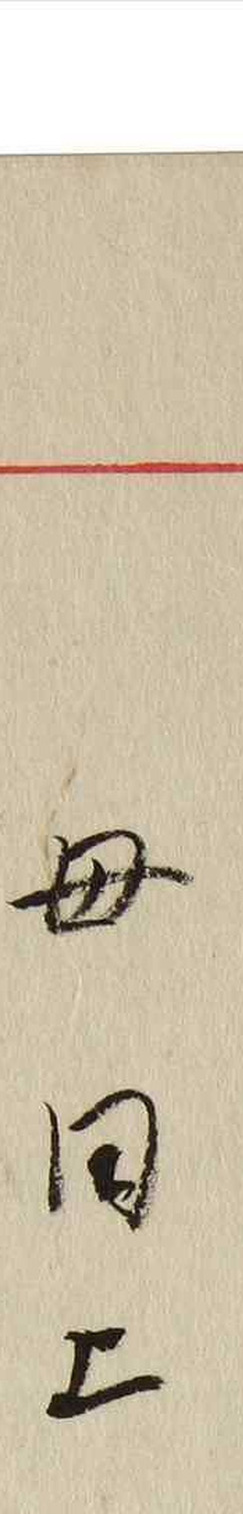母同上
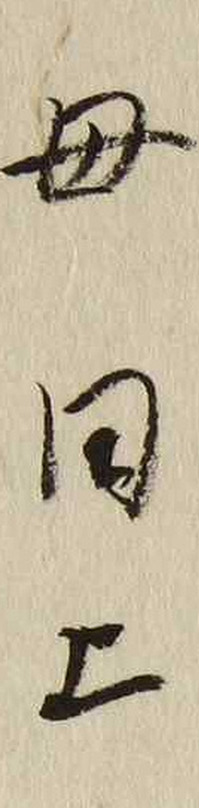母同上
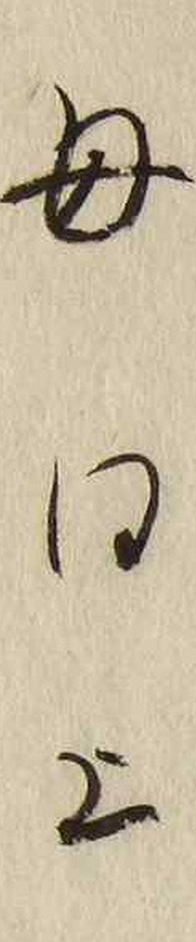母同上

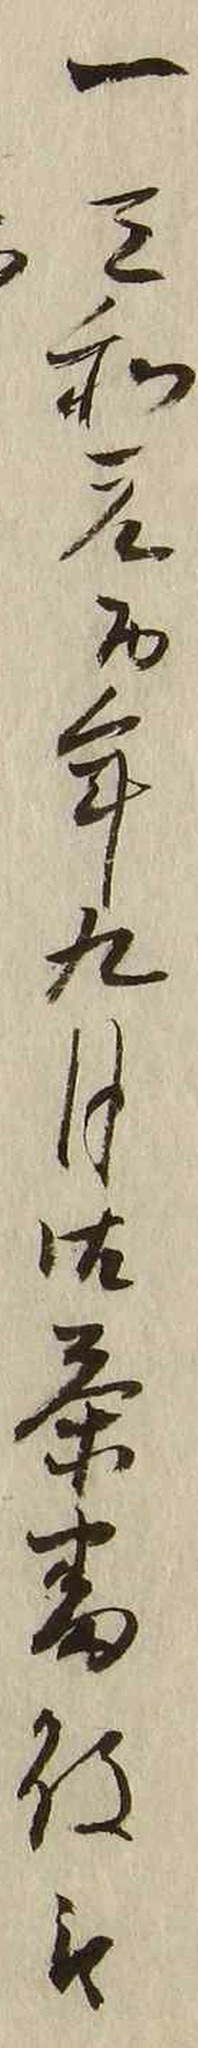一天和元酉年九月御茶番役被
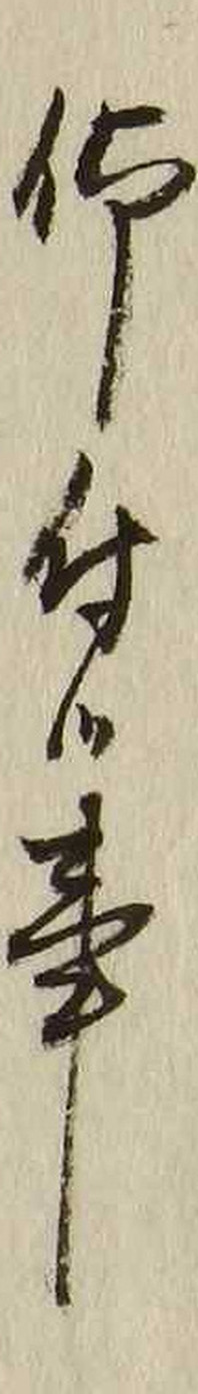仰付候事
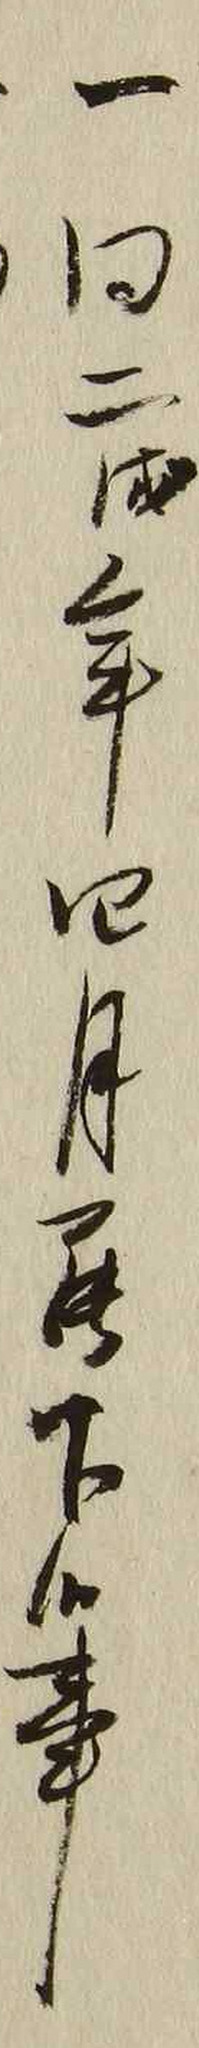一同二戌年四月罷下候事
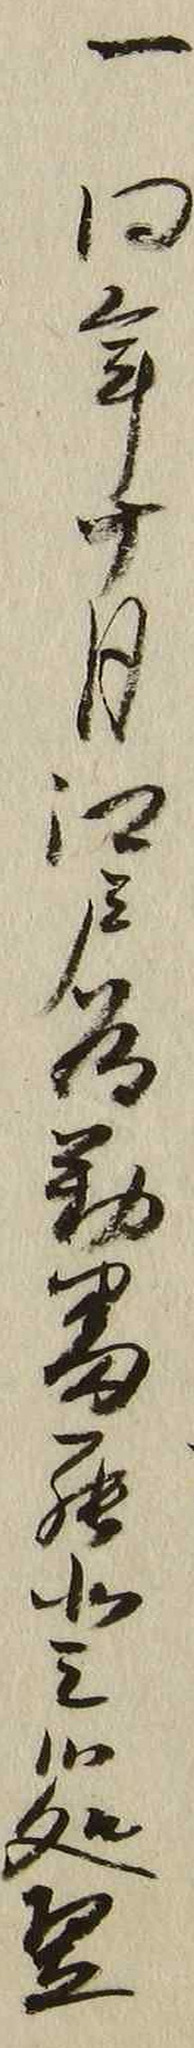一同年十月江戸為勤番罷登候処翌
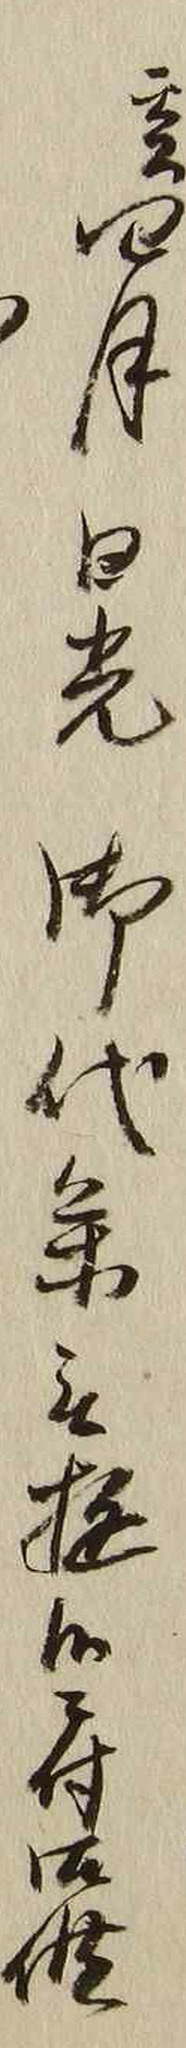亥四月日光御代参被遊候ニ付御供
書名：諸士系譜　巻之349　も之部5
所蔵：会津若松市立会津図書館
